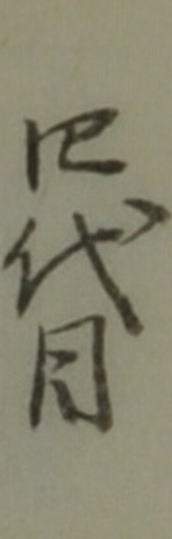四代目
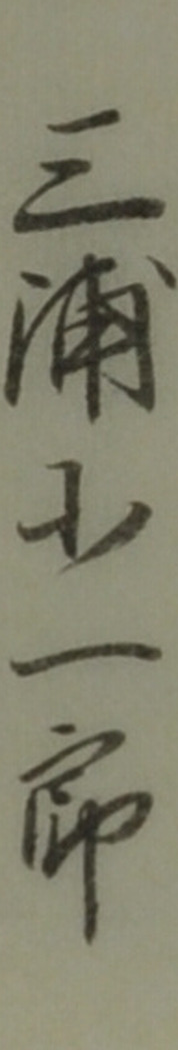三浦小一郎
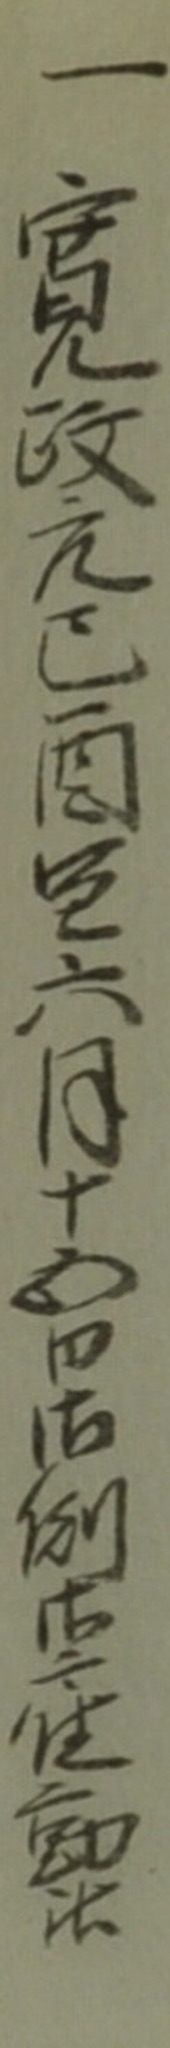一寛政元己酉閏六月十五日御側御雇勤被
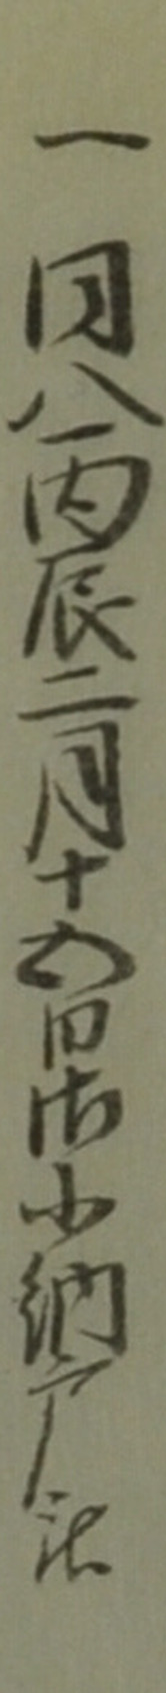一同八丙辰二月十五日御小納戸被
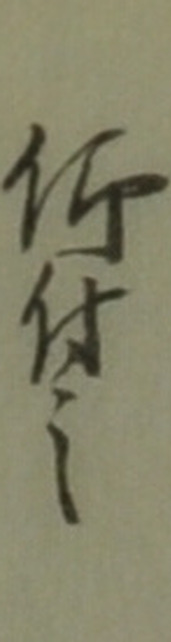仰付之
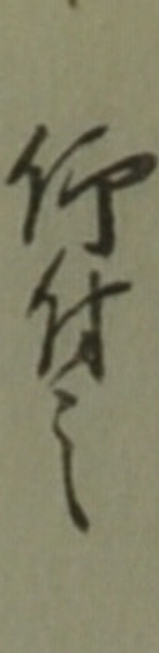仰付之
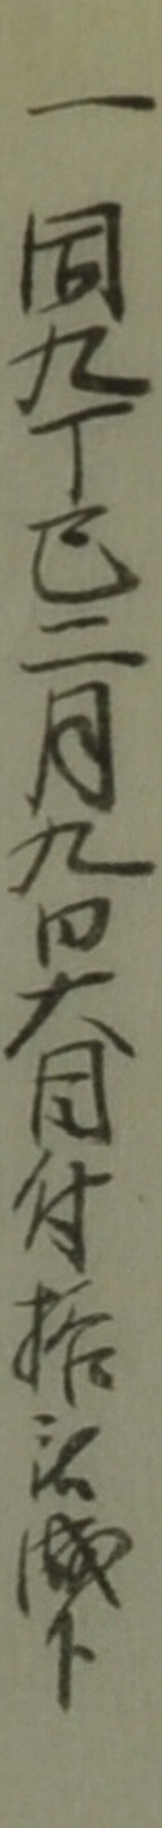一同九丁巳二月九日大目付格被成下
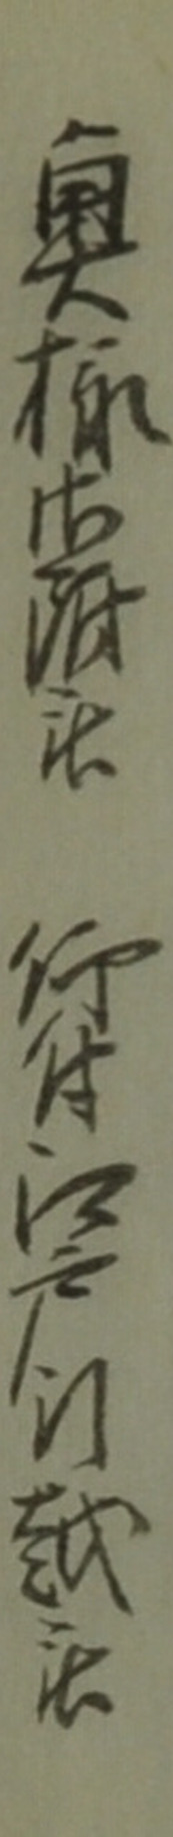奥様御附被仰付江戸引越被
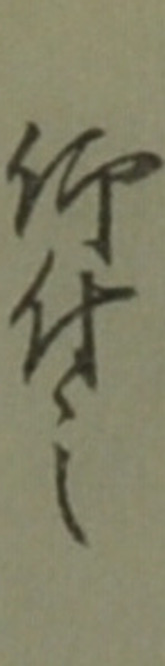仰付之
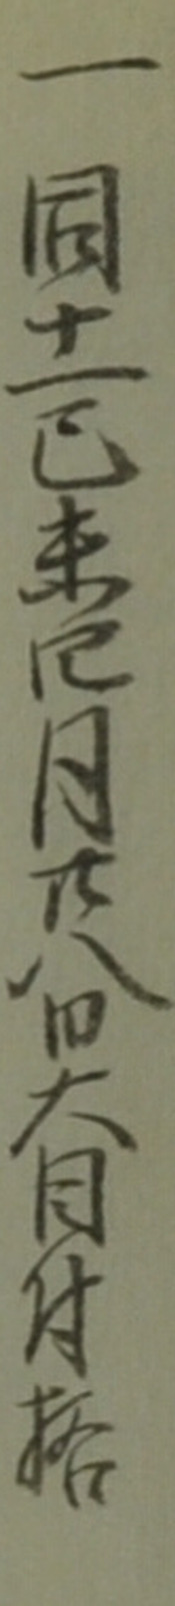一同十一己未四月廿八日大目付格
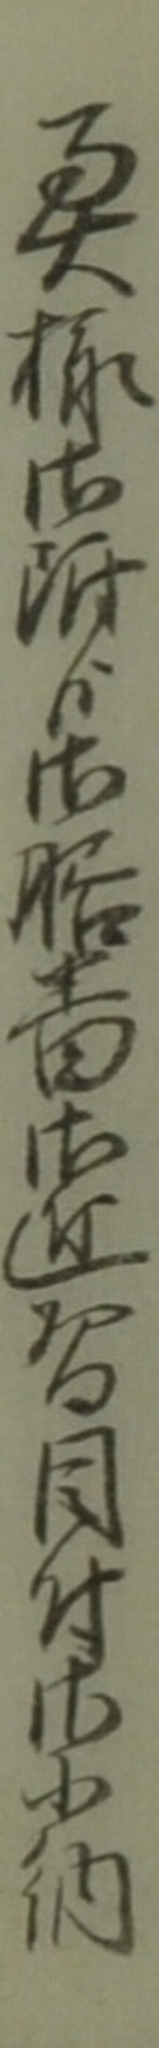奥様御附ゟ御膳番御近習目付御小納
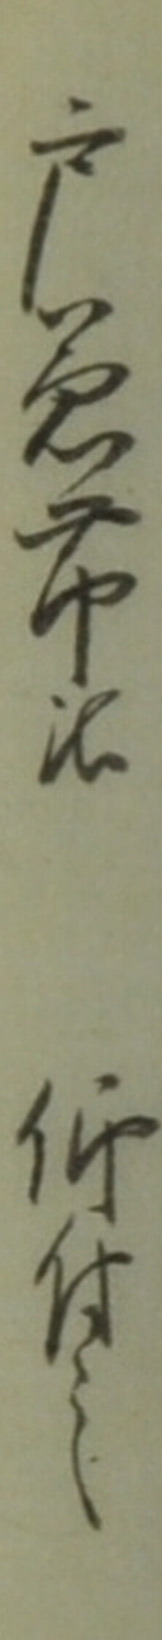戸兼帯被仰付之
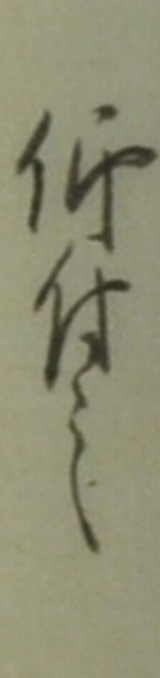仰付之

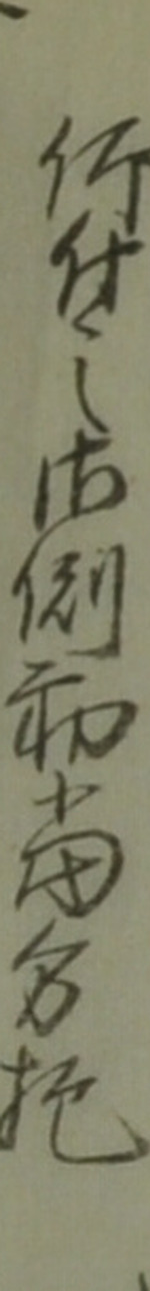仰付之御側当分抱
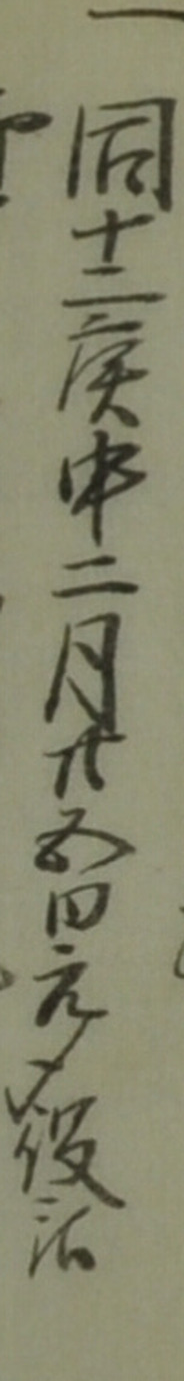一同十二庚申二月廿五日元〆役被
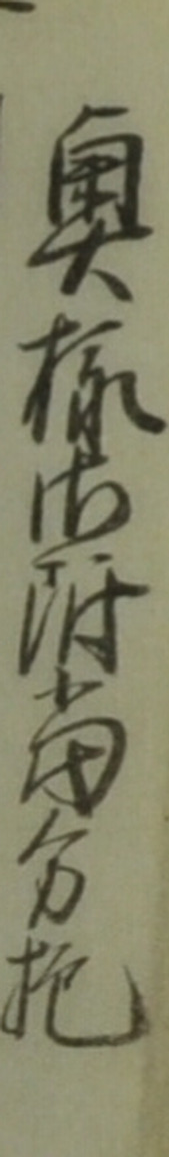奥様御附当分抱
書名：諸御役代々録（五）
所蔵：伊那市立高遠町図書館・合同会社AMANE
